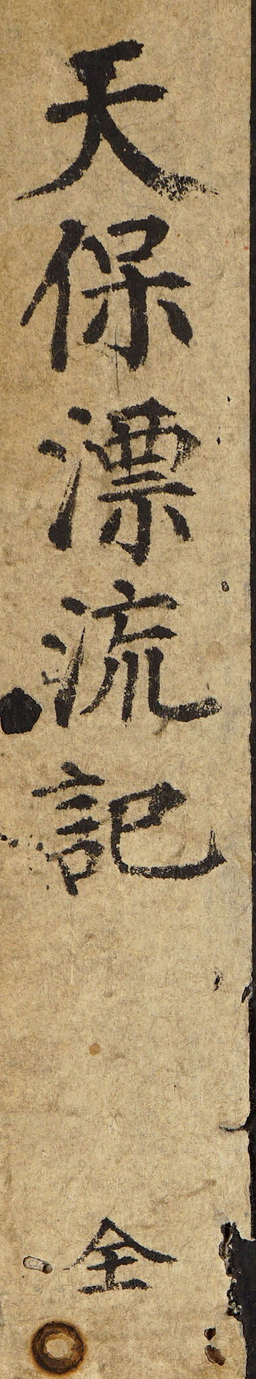天保漂流記全

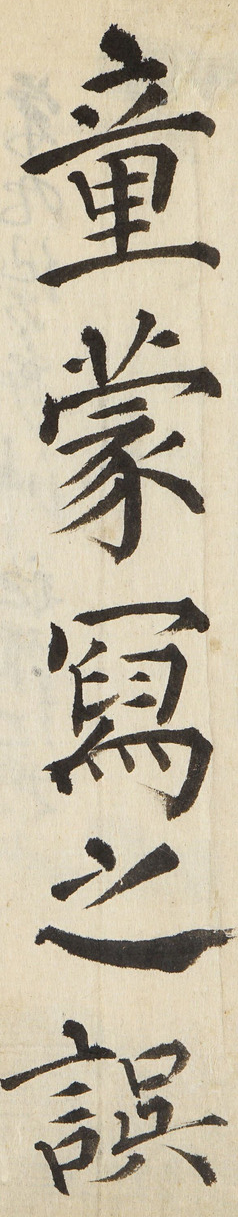童蒙写之誤
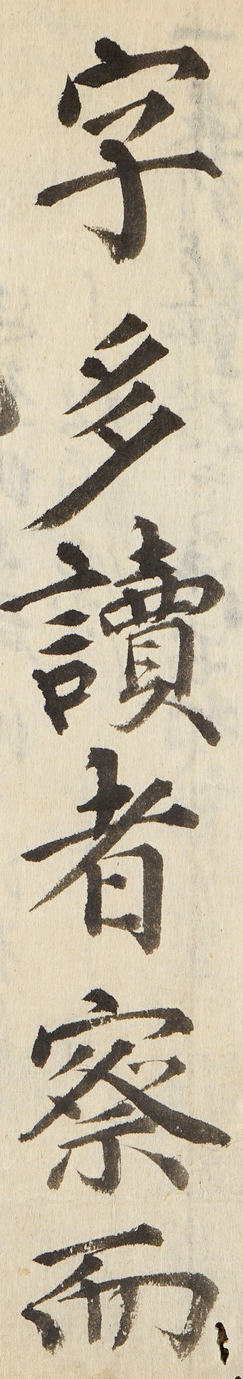字多読者察而
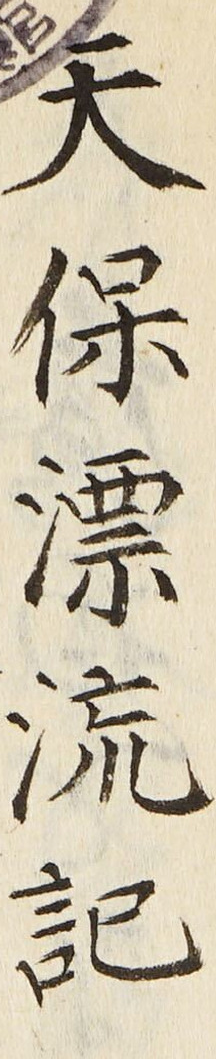天保漂流記
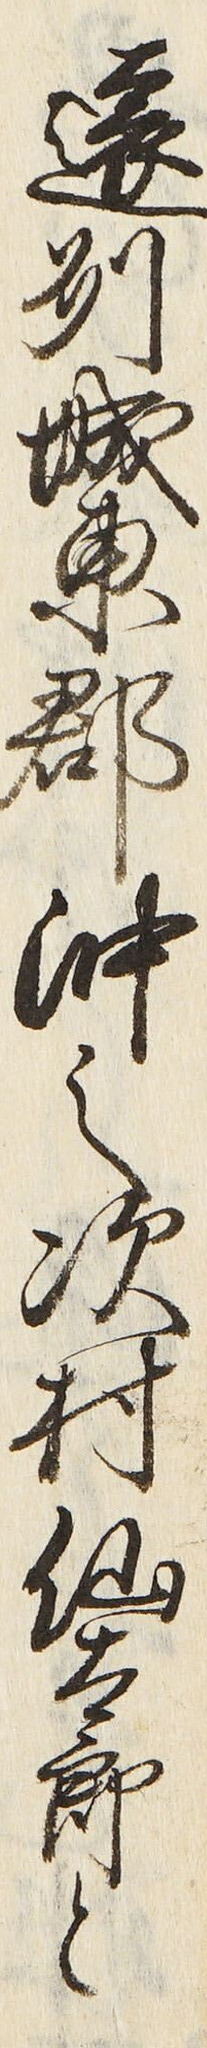遠州城東郡沖之沢村仙太郎と
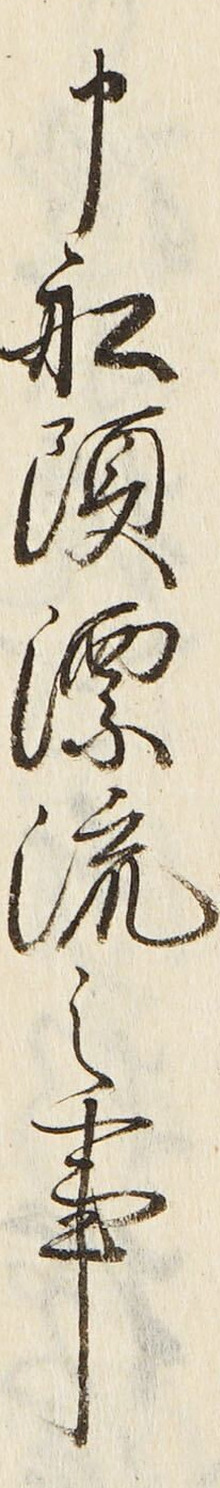申船頭漂流之事
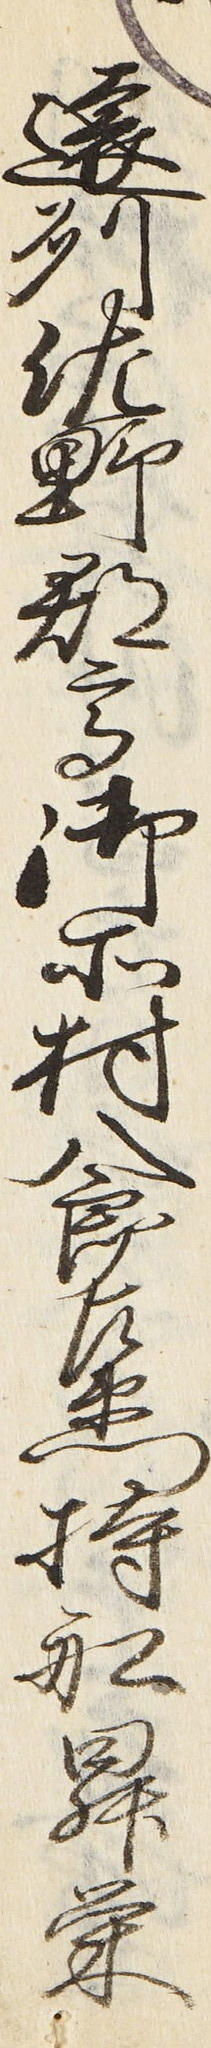一遠州佐野郡高御所村八郎左衛門持舩昇栄
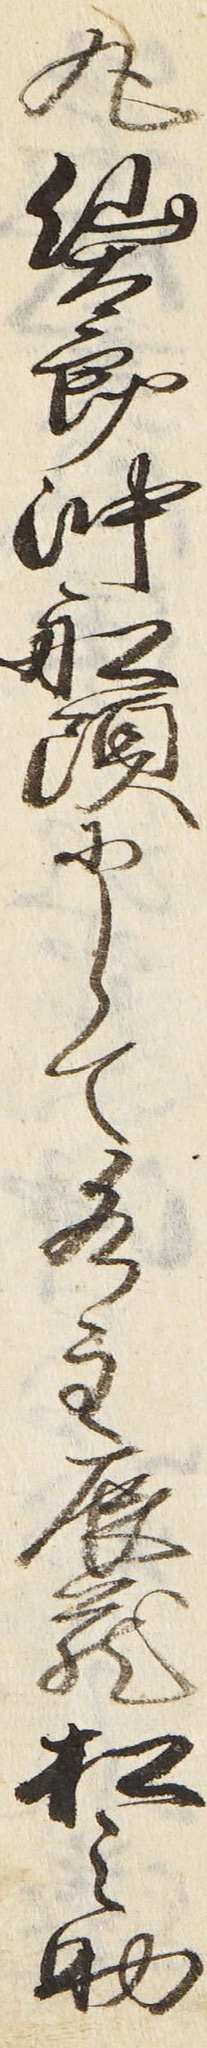丸仙太郎沖船頭にして水主辰蔵松之助
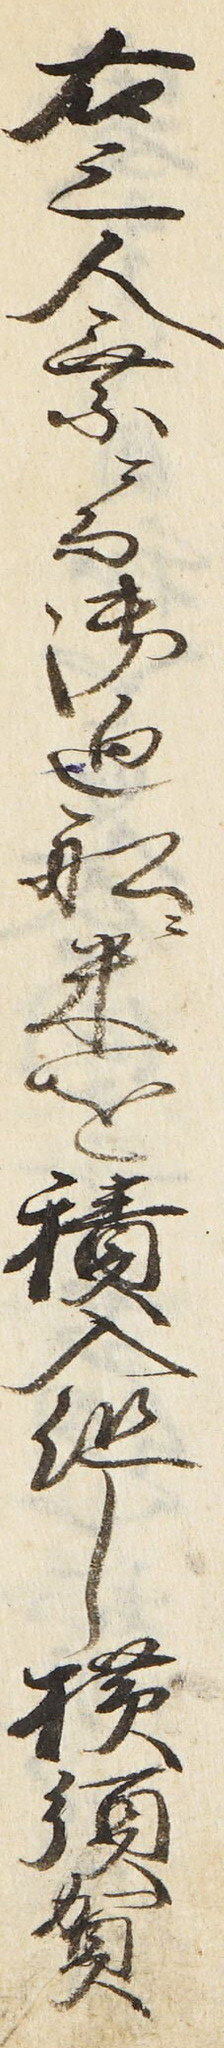右三人乗ニて御廻船ニ米を積入但し横須賀
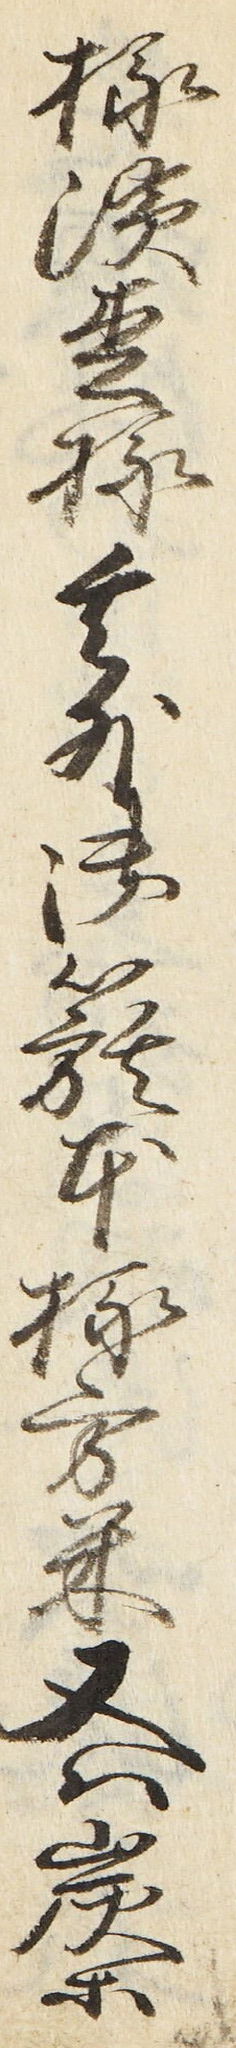様横松様其外御旗本様方米又ハ炭等
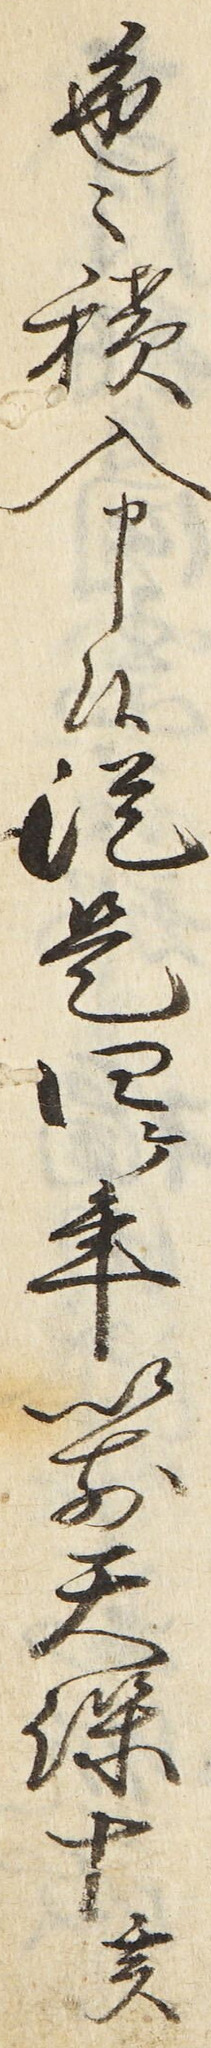色々積入申候従是四ヶ年以前天保十亥

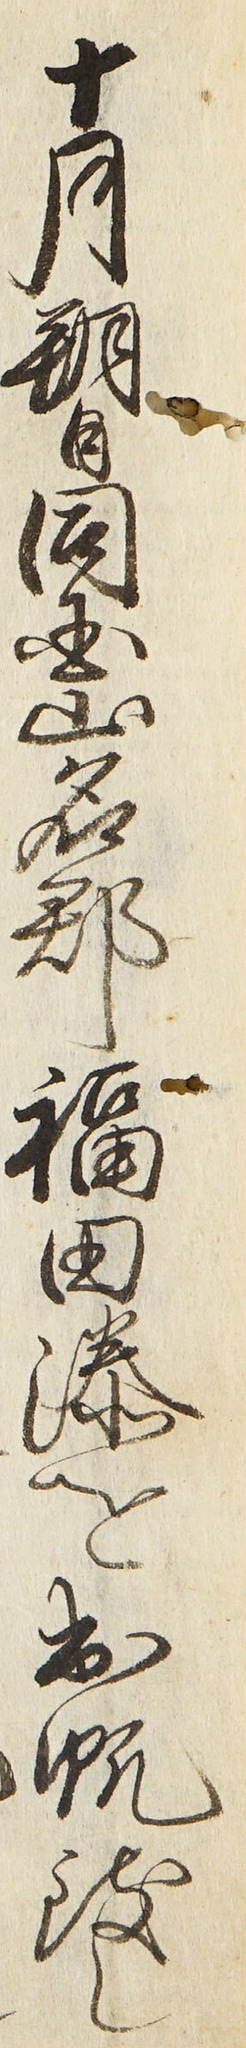十月朔日同国山名郡福田湊を出帆致し
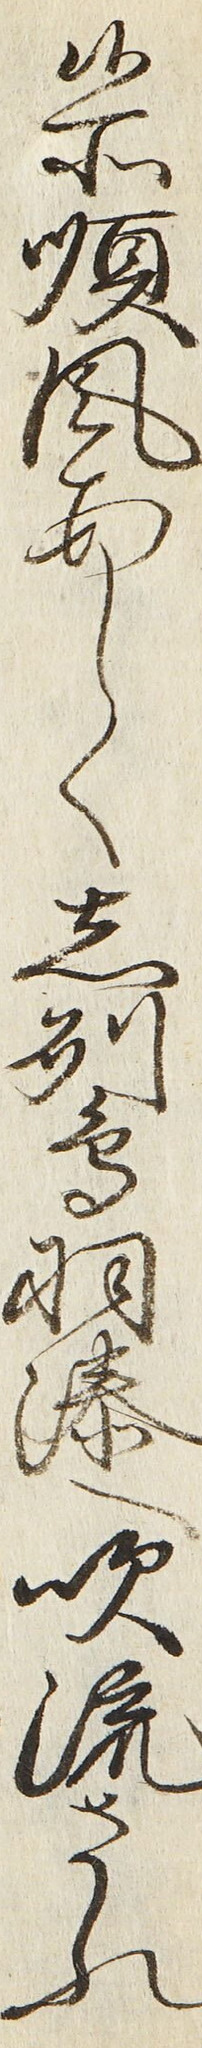候所順風あしくし列鳥羽湊へ吹流され
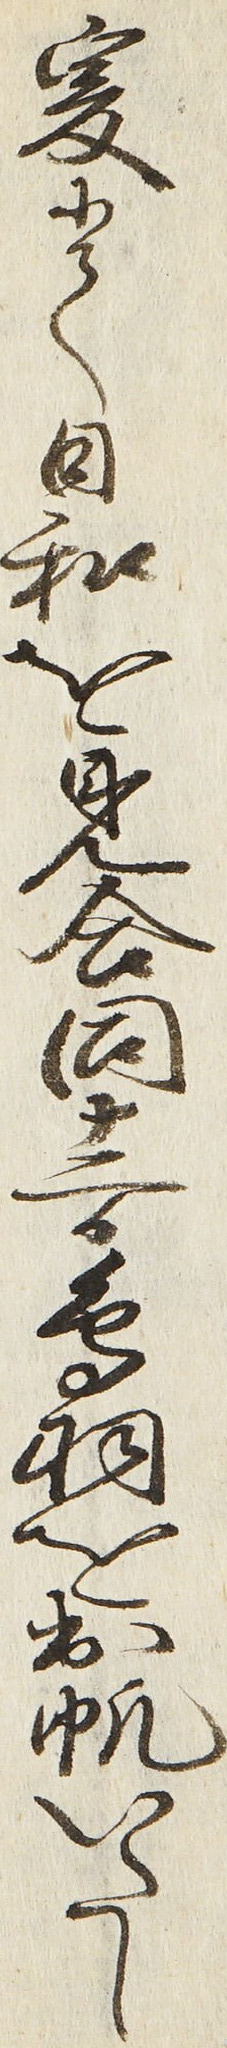爰にて日和を見合同十二日鳥羽を出帆いたし
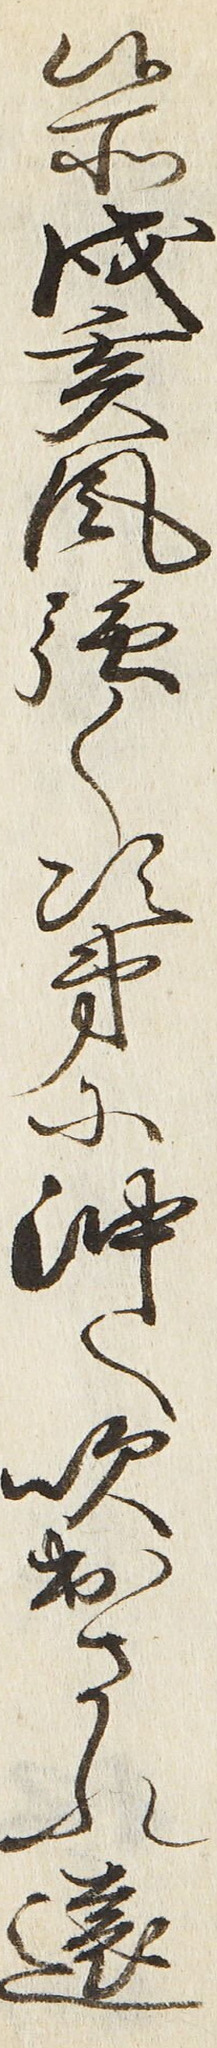候所戌亥風強く次第に沖へ吹出され遠
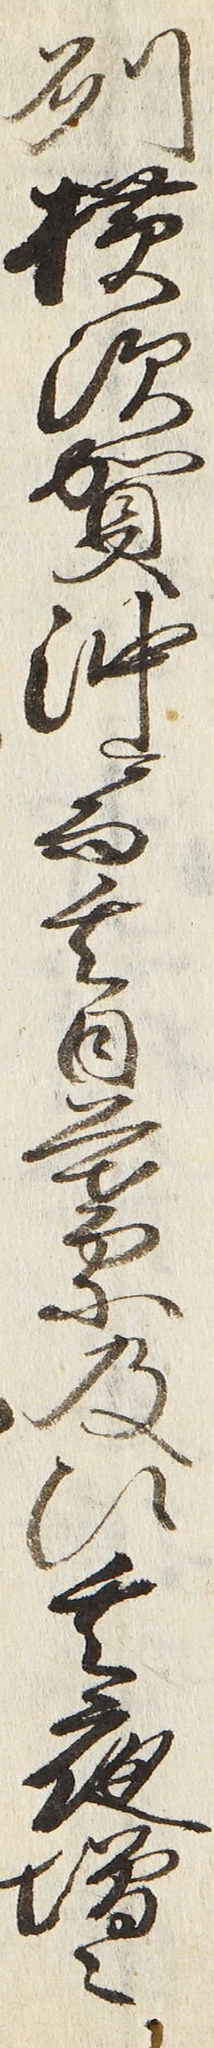州横須賀沖而其日暮に及ひ其夜増々
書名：天保漂流記
